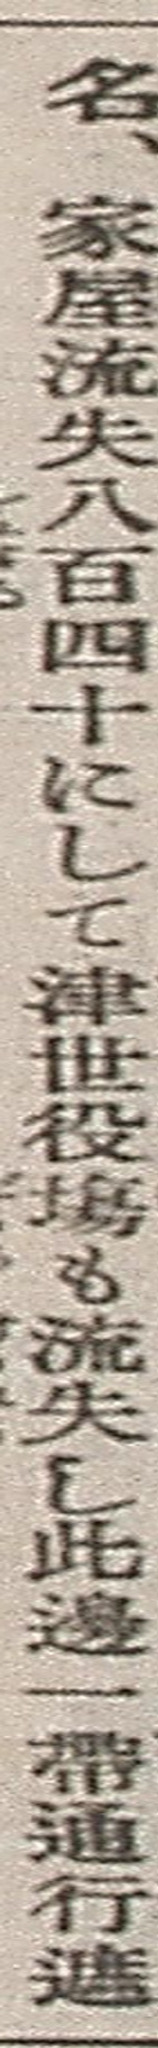名、家屋流失八百四十にして津世役場も流失し此辺一帯通行遮
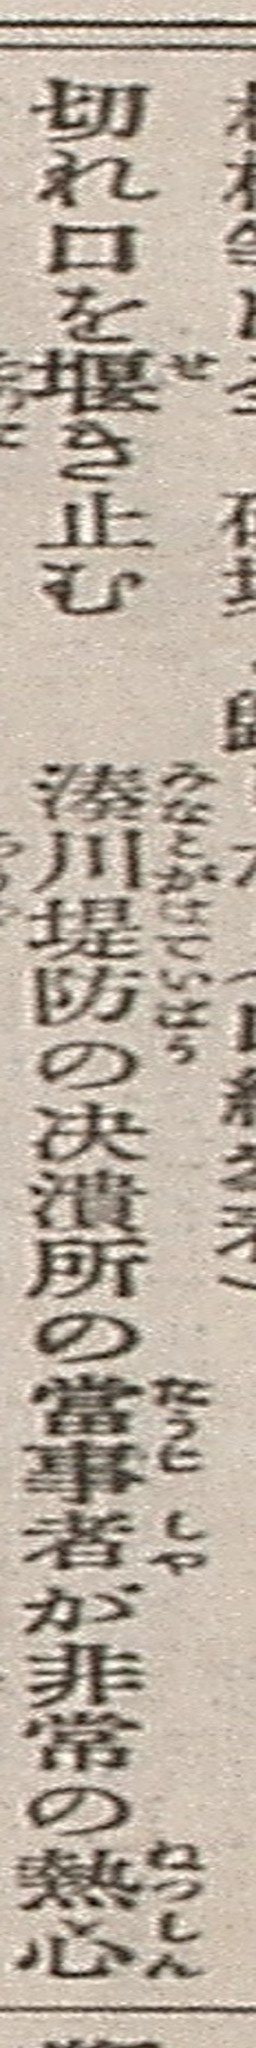切れ口を堰き止む湊川堤防の决潰所の当事者が非常の熱心
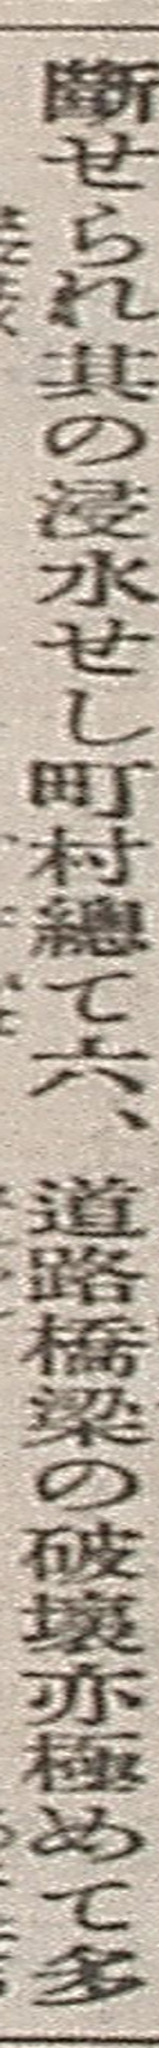断せられ其の浸水せし町村総て六、道路橋梁の破壊亦極めて多
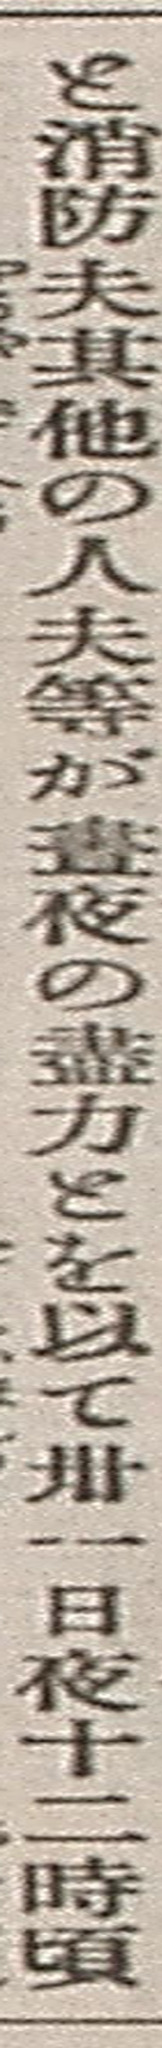と消防夫其他の人夫等が晝夜の尽力とを以て卅一日夜十二時頃
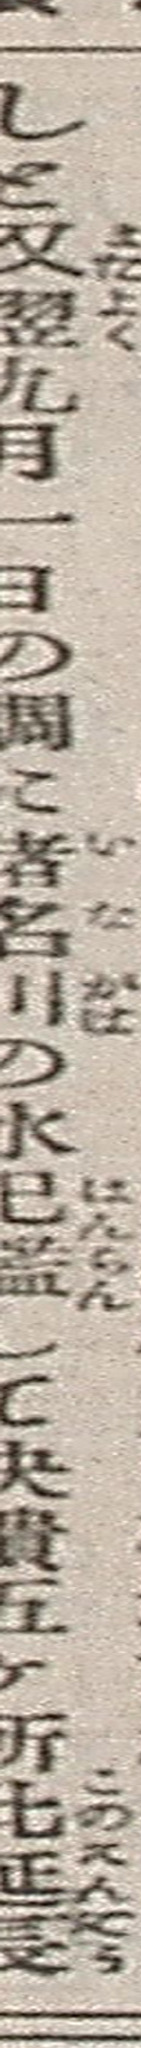しと又翌九月一日の調に猪名川の水氾濫して决潰五ヶ所此延長
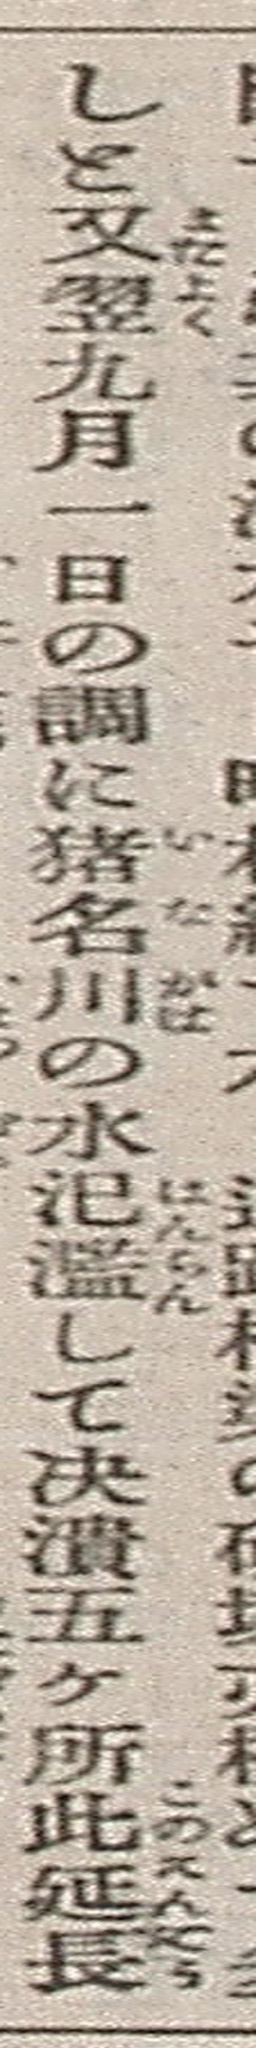しと又翌九月一日の調に猪名川の水氾濫して决潰五ヶ所此延長
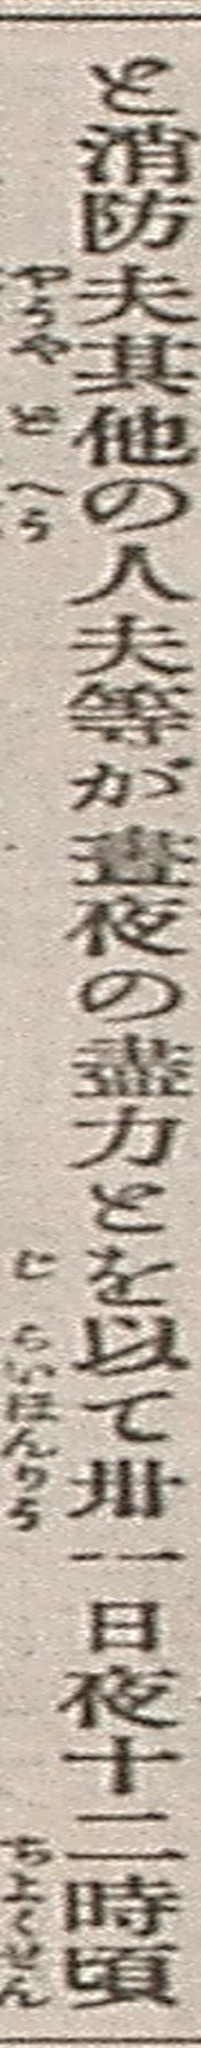と消防夫其他の人夫等が晝夜の尽力とを以て卅一日夜十二時頃
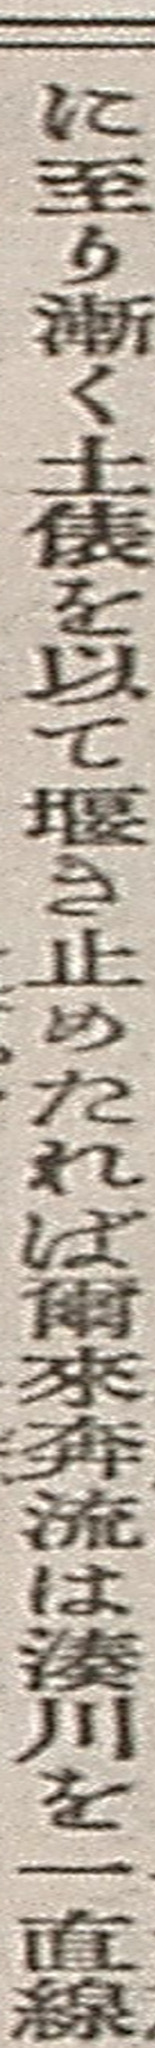に至り漸く土俵を以て堰き止めたれば爾来奔流は湊川を一直線
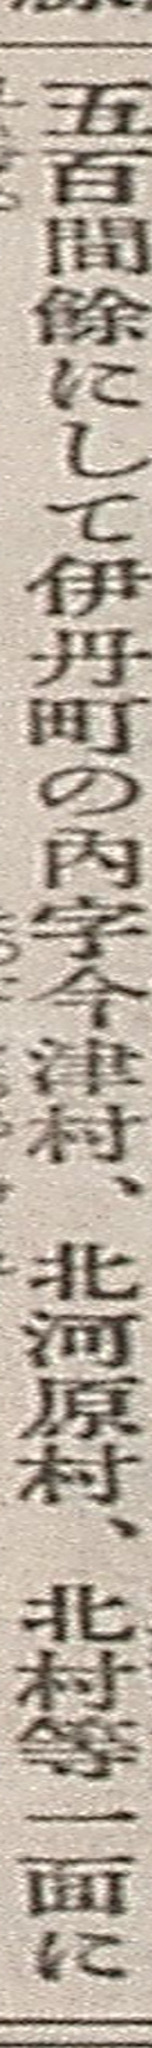五百餘間にして伊丹町の内字今津村、北河原村、北村等一面に
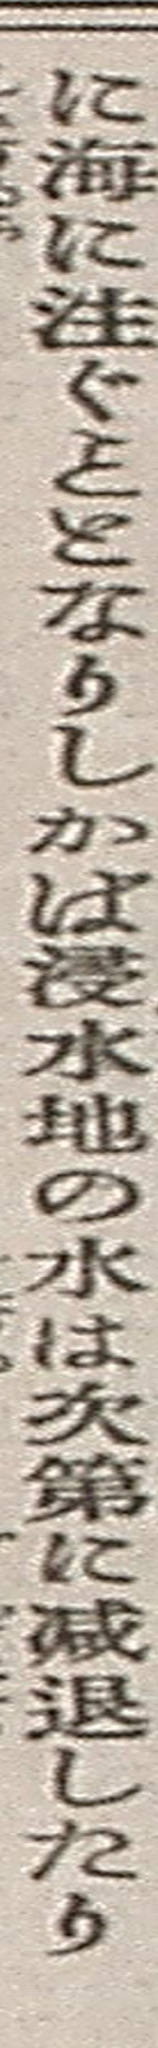に海に注ぐことなりしかば浸水地の水は次第に減退したり
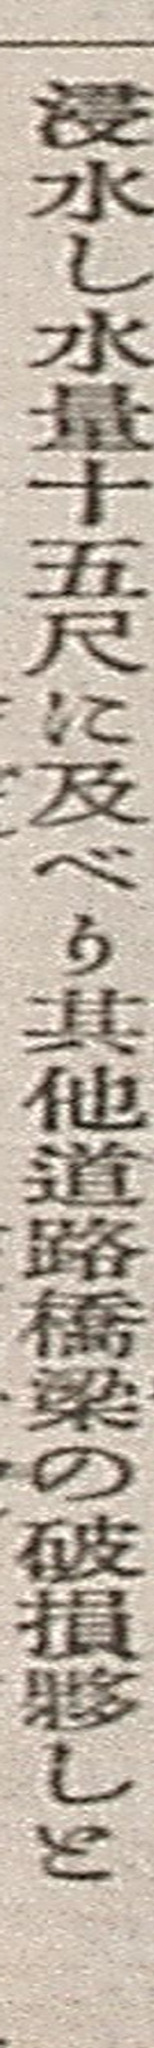浸水し水量十五尺に及べり其他道路橋梁の破損夥しと
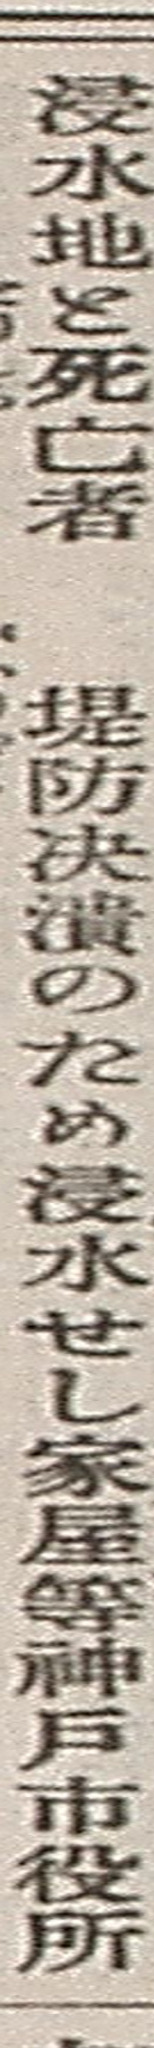浸水地と死亡者堤防决潰のため浸水せし家屋等神戸市役所
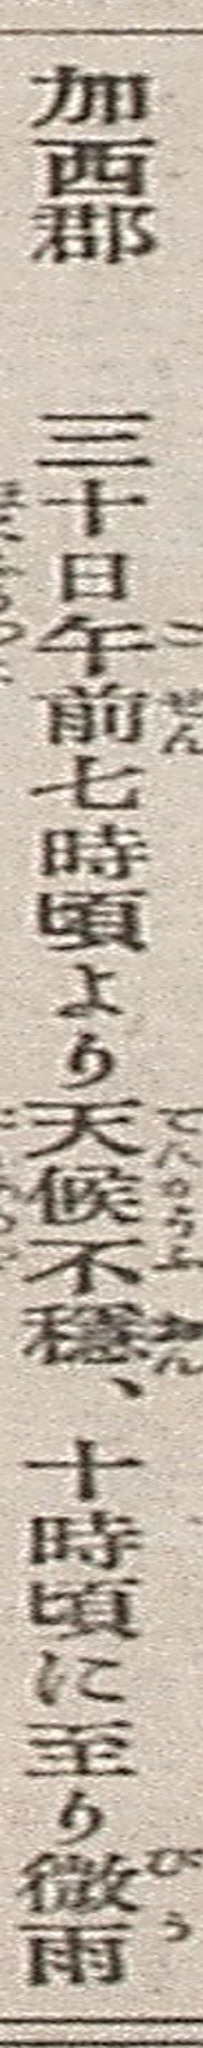加西郡三十日午前七時頃天候不穏、十時頃に至り微雨
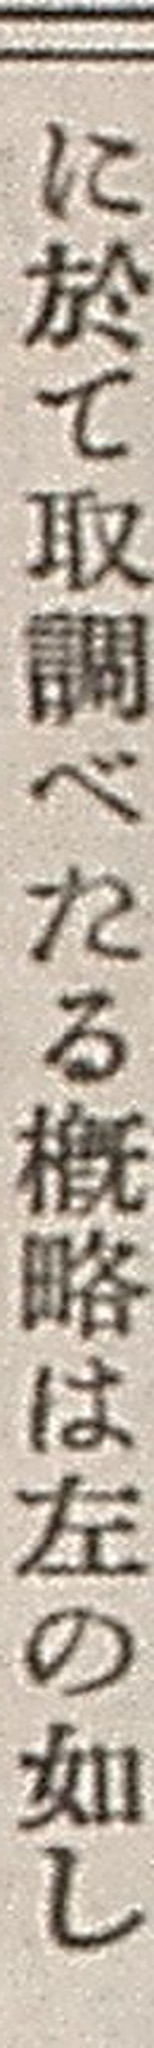に於て取調べたる概略左の如し
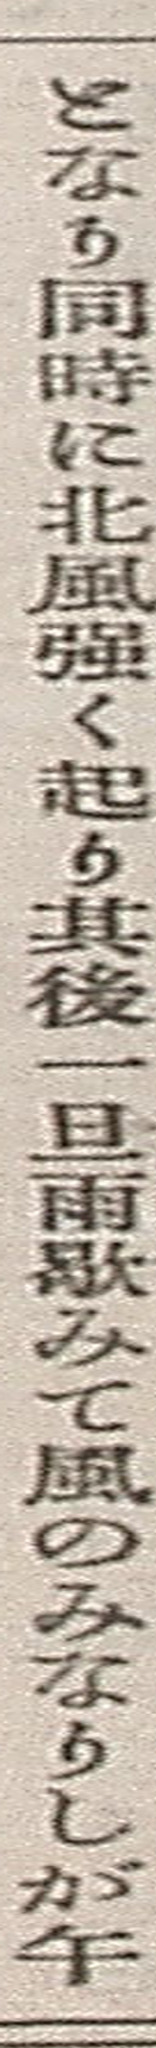となり同時に北風強く起り其後一旦雨歇みて風のみなりしが午
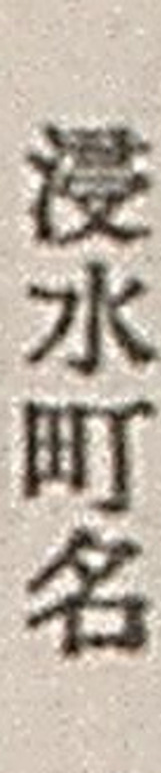浸水町名
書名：風俗畫報臨時増刊第百二十八號　洪水被害録（下）
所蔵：東京大学地震研究所図書室 Earthquake Research Institute Library, The University of Tokyo, JAPAN
